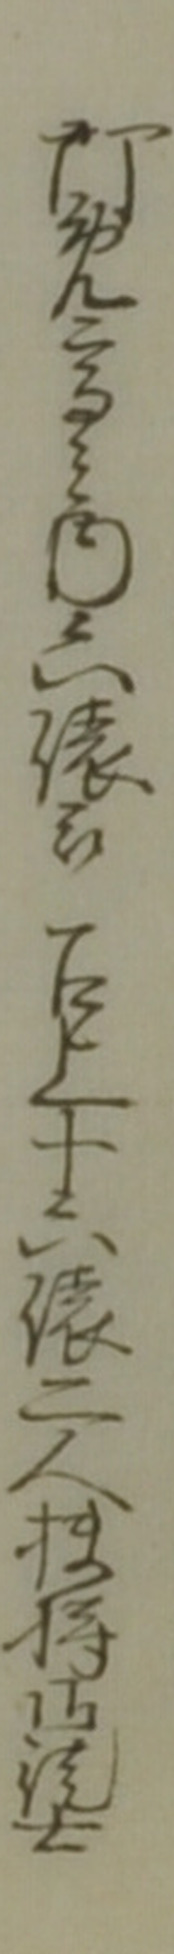御免高之内六俵被召上十六俵二人扶持御徒士
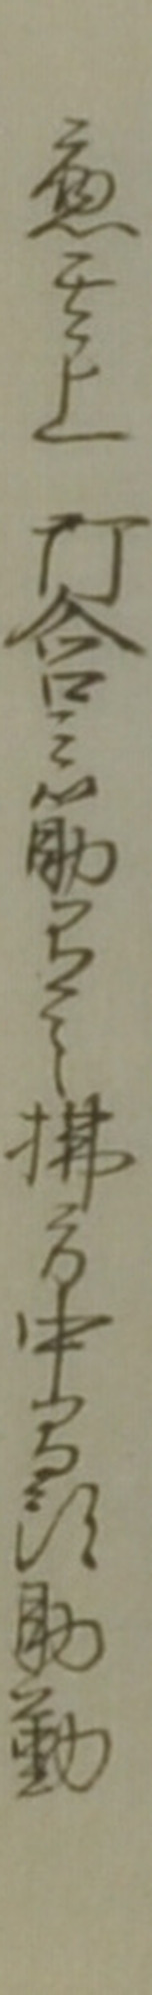応其上御含之筋有之払方中間頭助勤
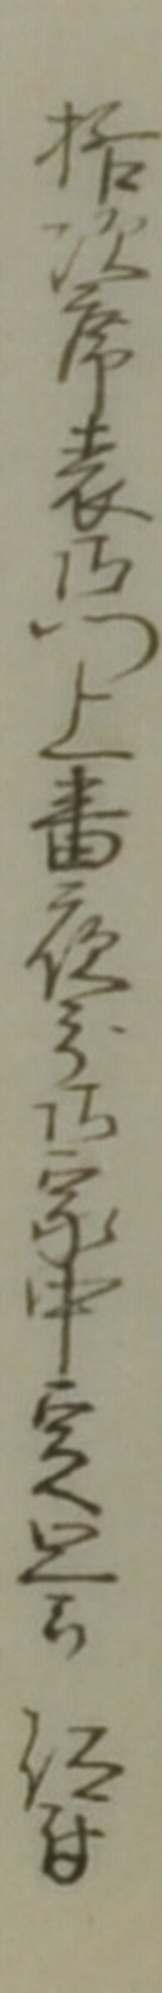格次席表御門上番夜分御家中定廻被仰付
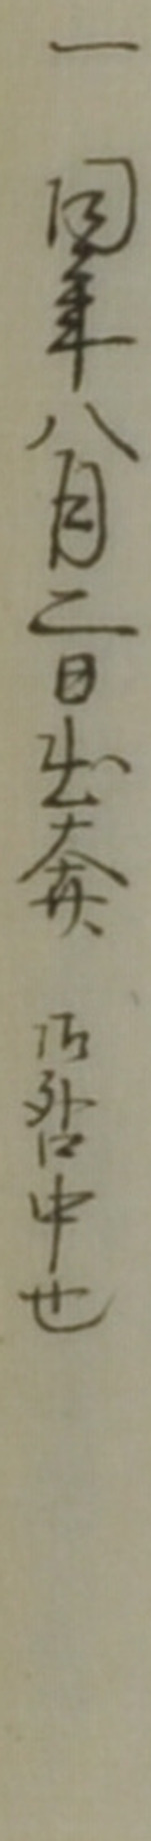一同年八月二日出奔御咎中也
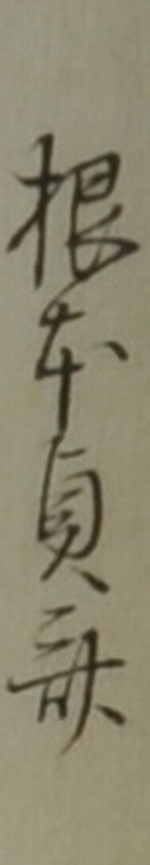根本貞斎
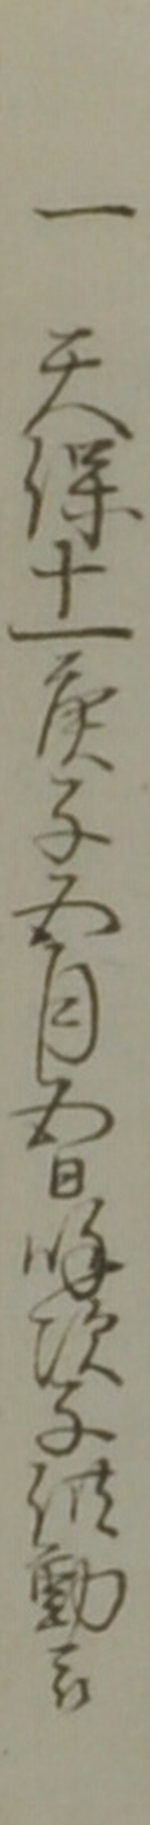一天保十一庚子五月五日呼次子供勤被

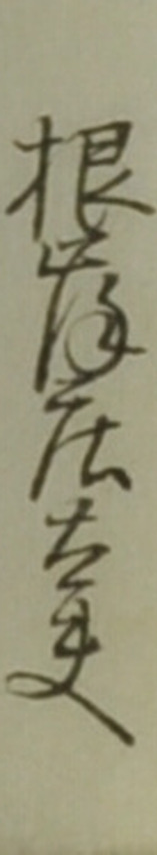根岸庄太夫
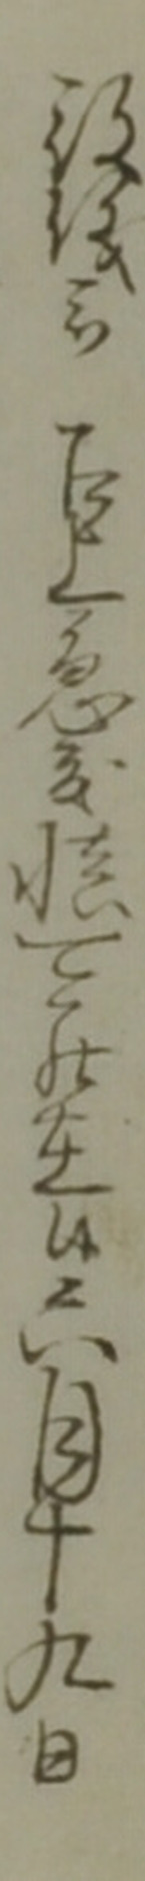役儀被召上急度慎可罷在候六月十九日
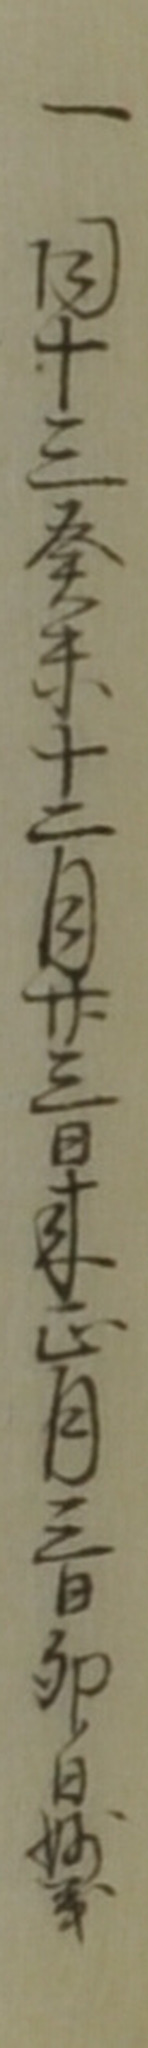一同十三癸未十二月廿三日来正月三日卯日妙義
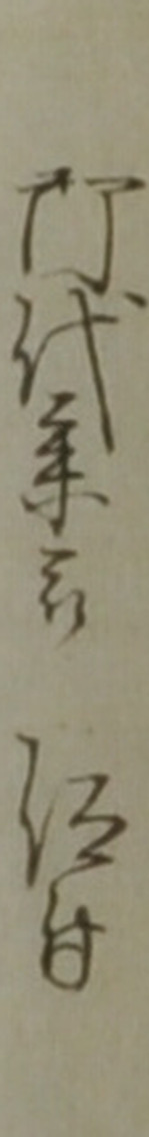御代参被仰付
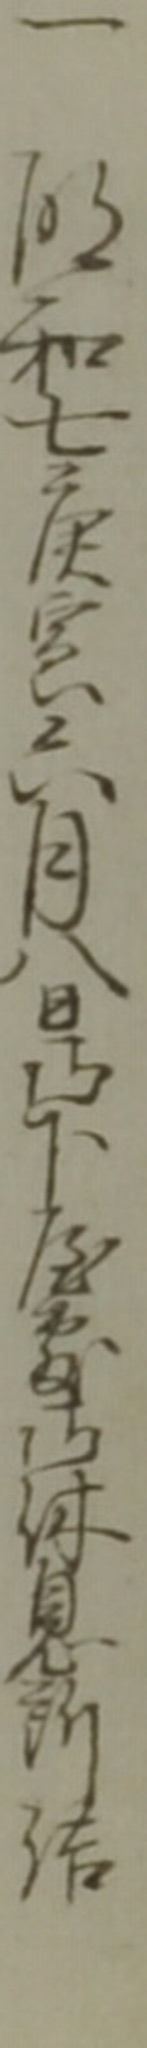一明和七庚寅六月八日御下屋敷御休息所詰
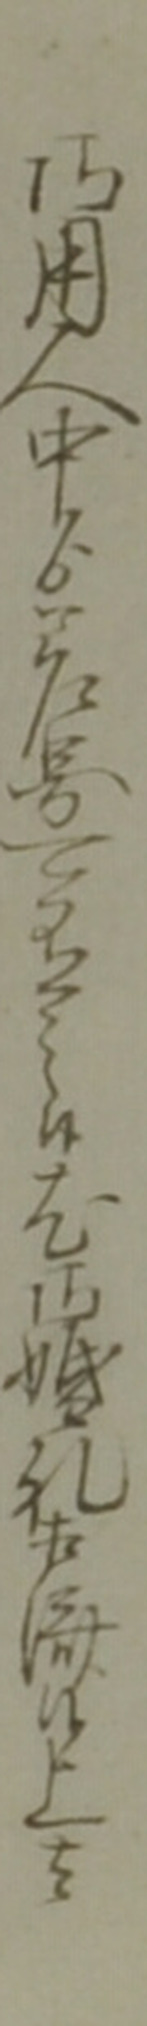御用人中ゟ指図可有之候尤御婚礼相済候上者
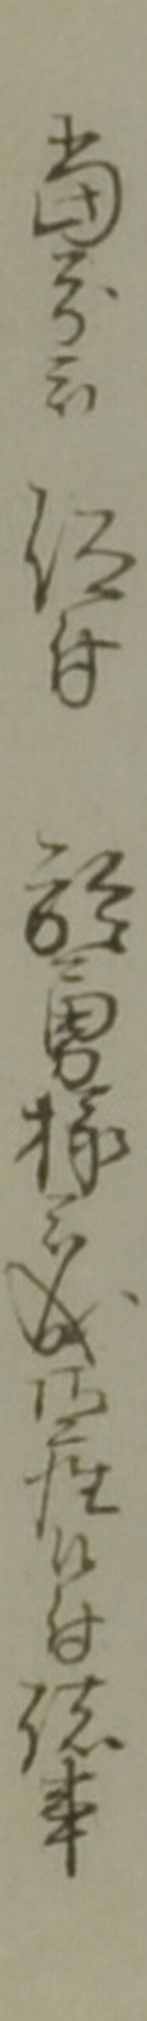当分被仰付於勇様被成御座候付諸事
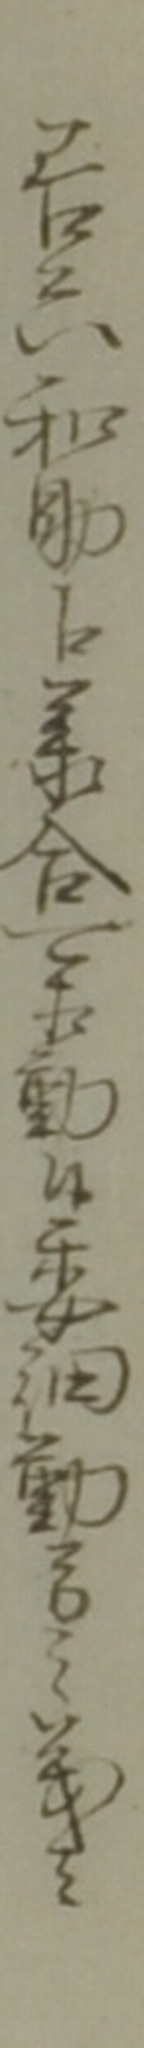善六和助江承合可相勤候委細勤方之義者
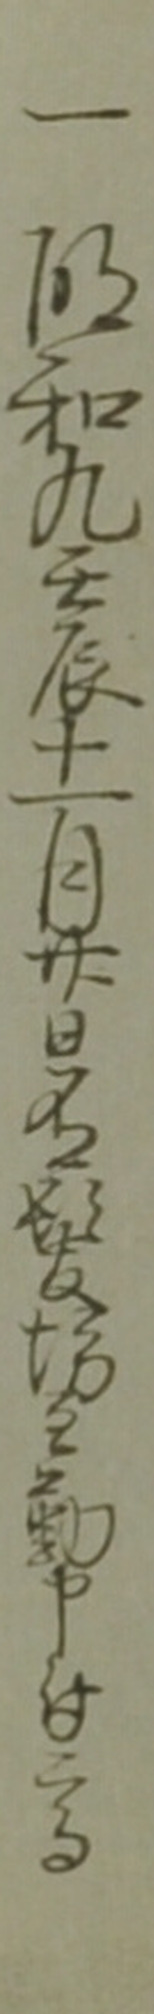一明和九壬辰十一月廿日有髪坊主勤申付高
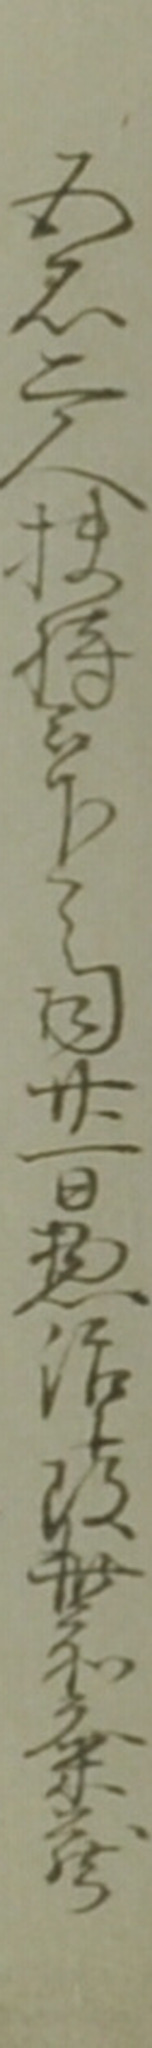五石二人扶持被下之同廿一日惣治改此前粂蔵
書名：無足廃家（弐）
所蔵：伊那市立高遠町図書館・合同会社AMANE
